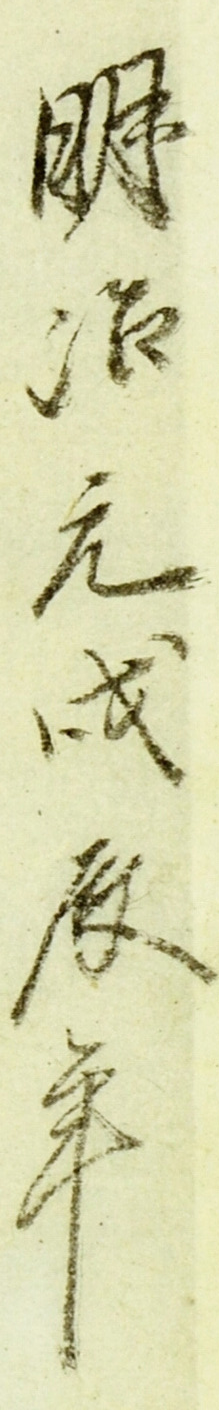明治元戊辰年
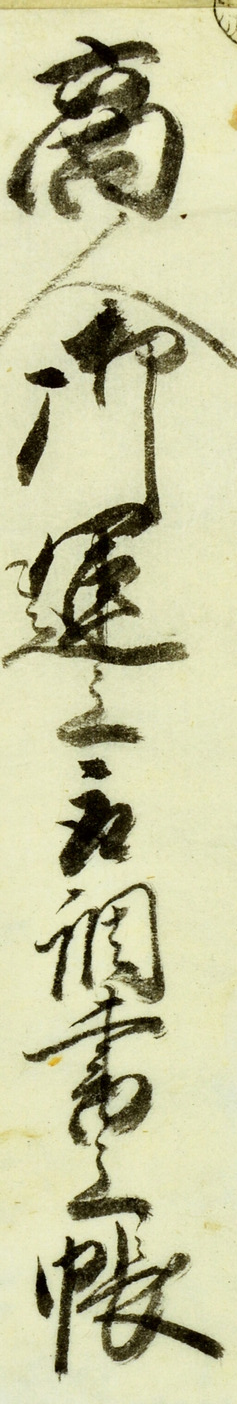商人御運上取調書上帳
